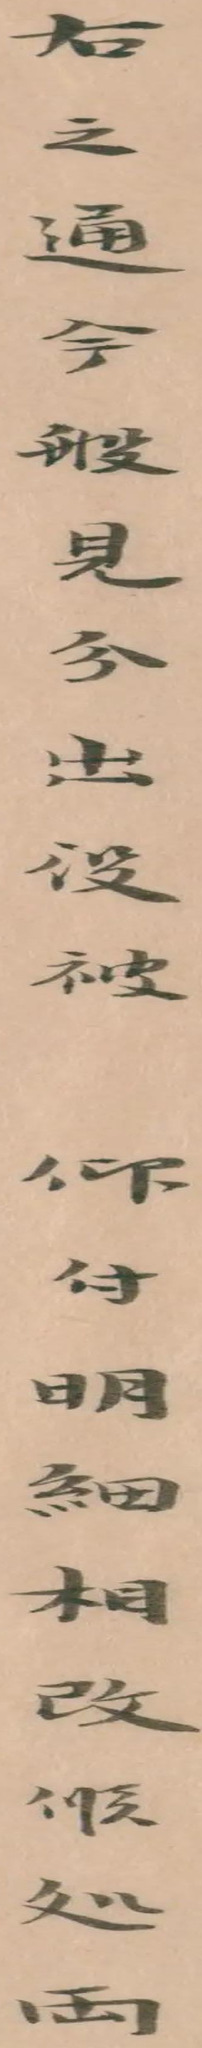右之通今般見分出役被仰付明細相改候処両
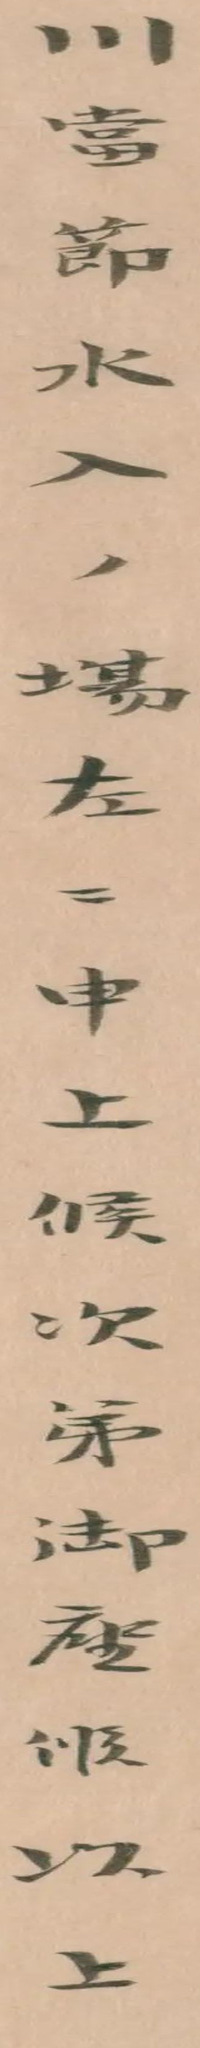川当節水入ノ場左ニ申上候次第御座候以上

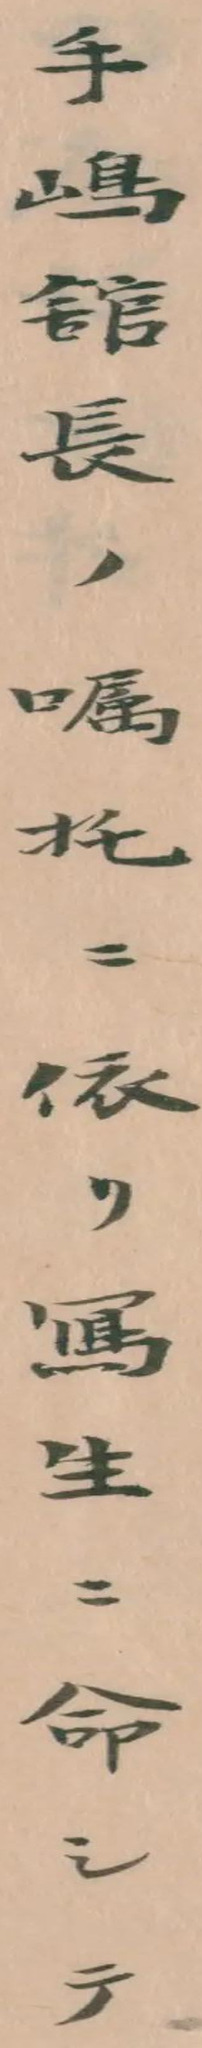手嶋舘長ノ嘱托ニ依リ写生ニ命シテ
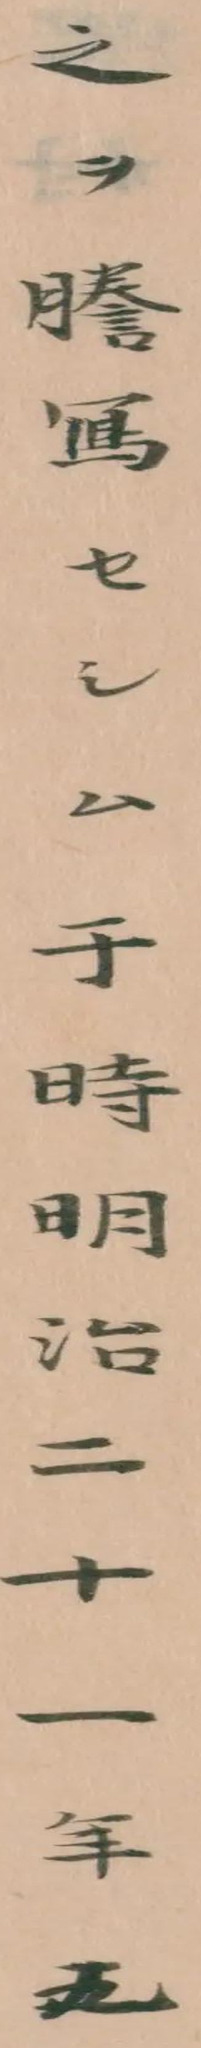之ヲ謄写セシム于時明治二十一年九
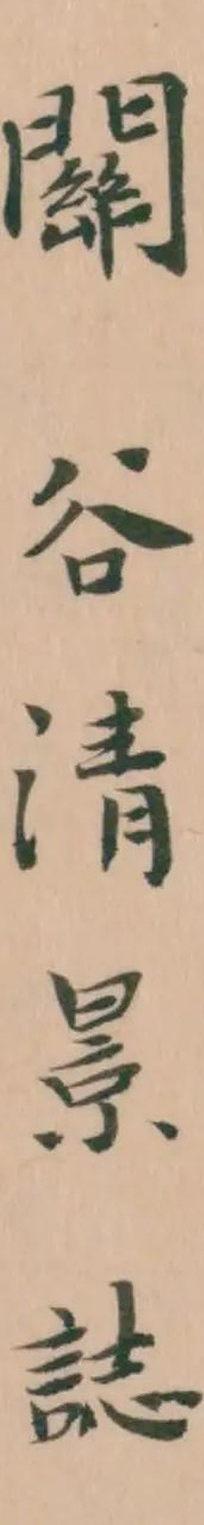関谷清景誌
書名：地災撮要. 巻5-6(地震之部)
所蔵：国立国会図書館 National Diet Library, JAPAN
